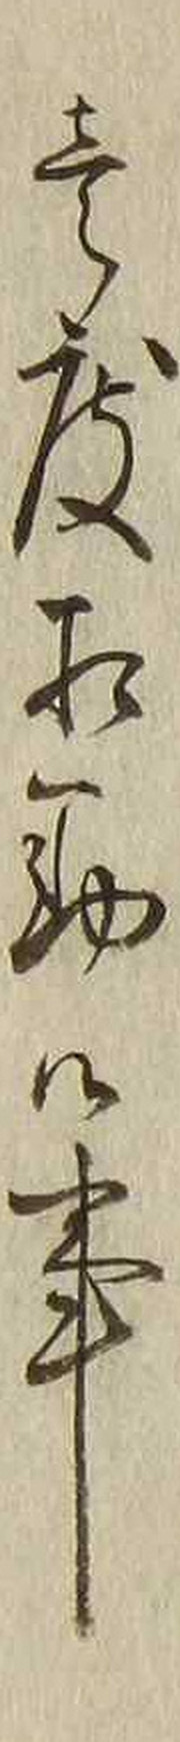壱度相勤候事
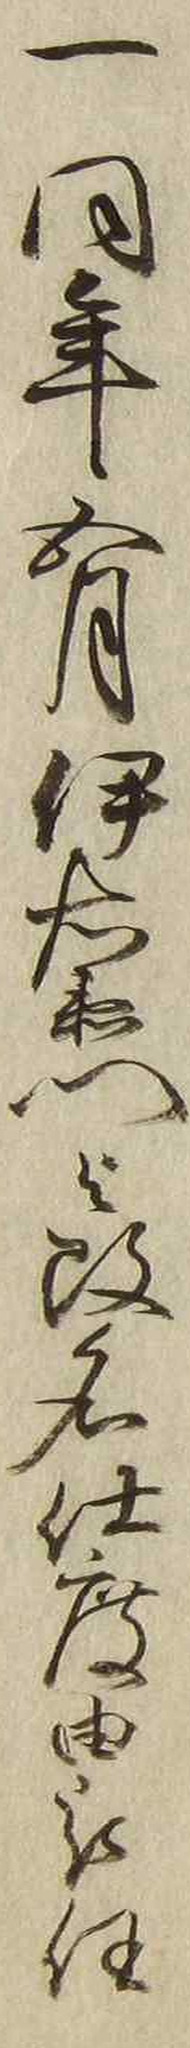一同年五月伊右衛門与改名仕度由被任

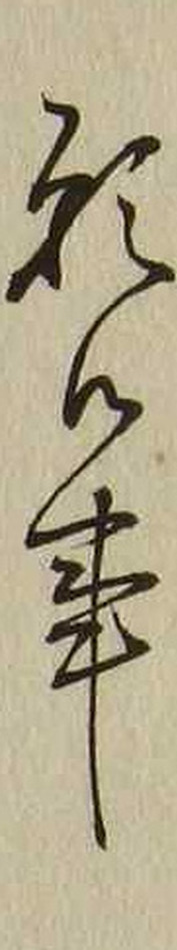願候事
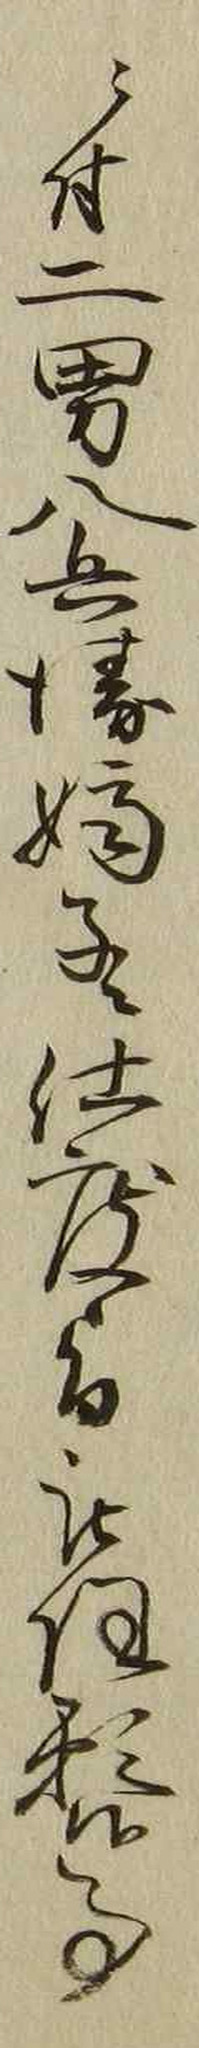ニ付二男八兵衛嫡子ニ仕度旨被任願候事
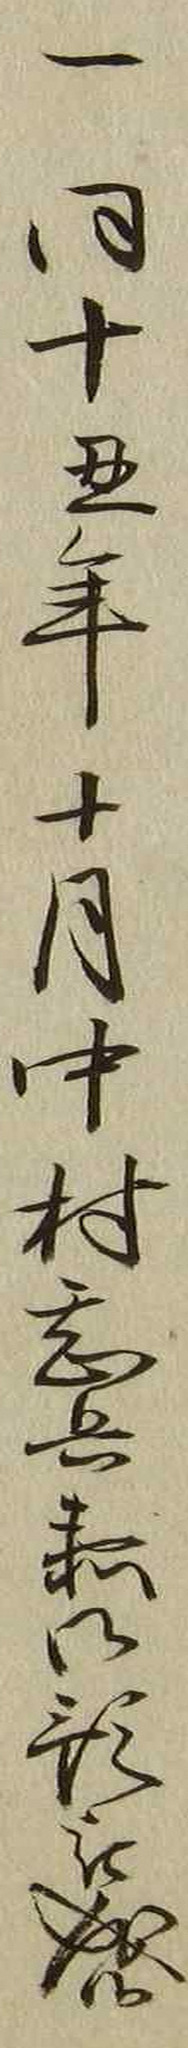一同十丑年十月中村甚兵衛御預被成候
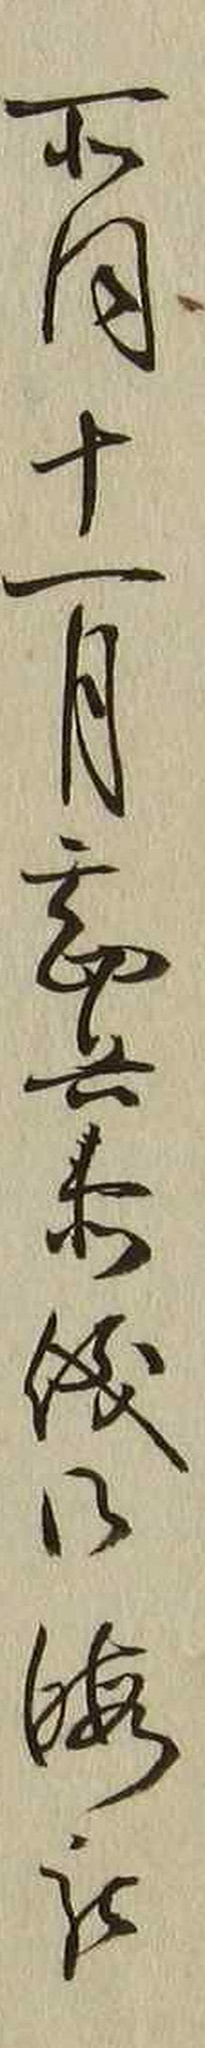所同十一月甚兵衛儀御暇被
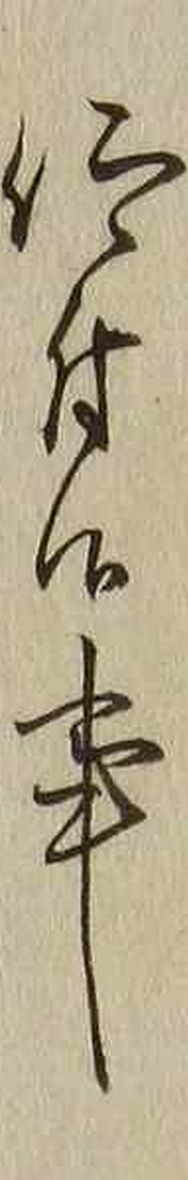仰付候事
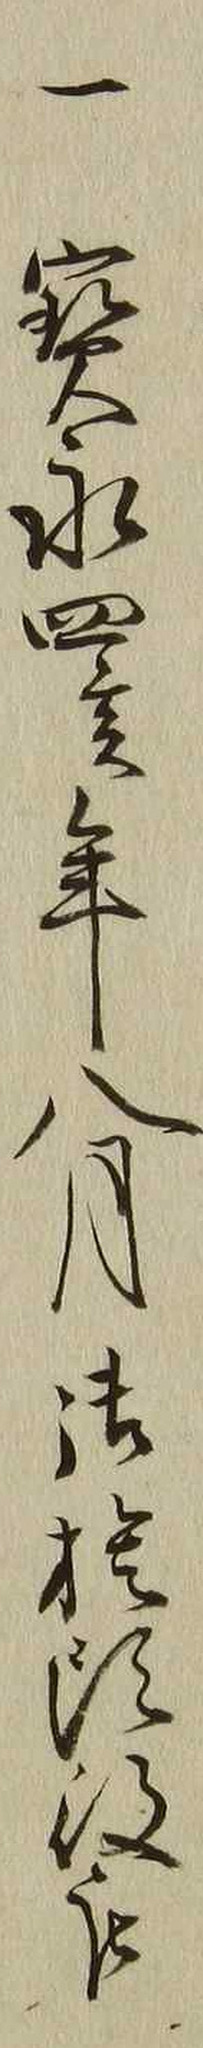一寛永四亥年八月御捨頭役被
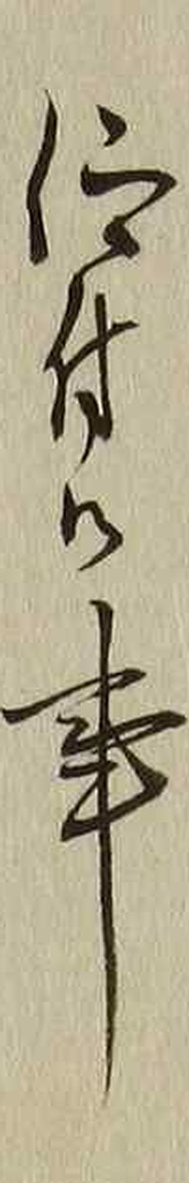仰付候事
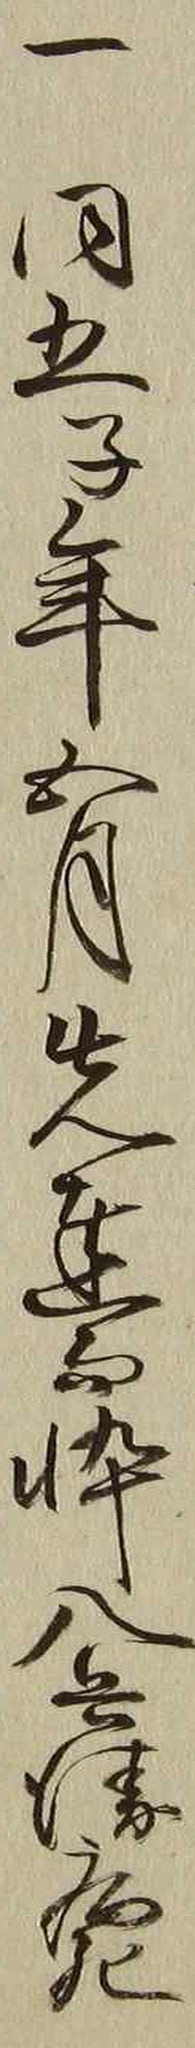一同五子年五月先連而忰八兵衛病死
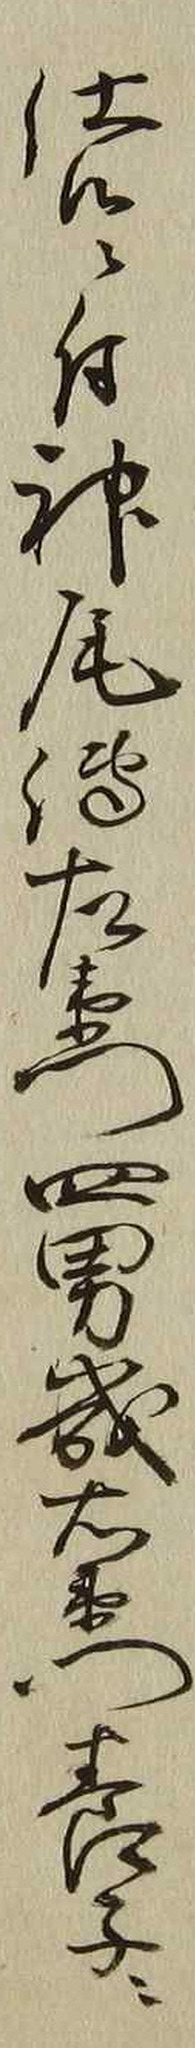仕候ニ付神尾伝左衛門四男幾右衛門養子ニ
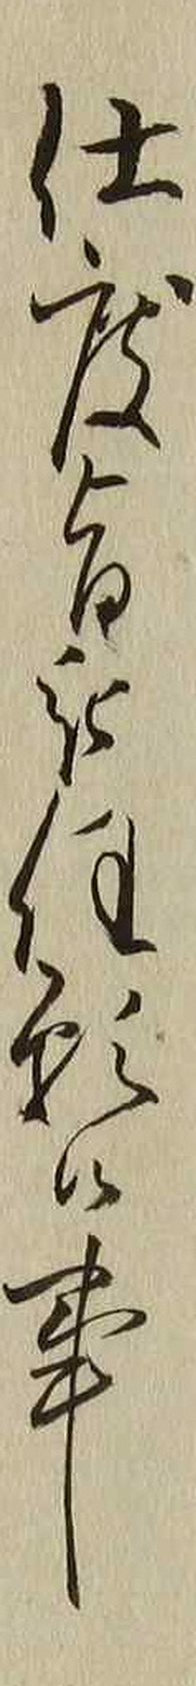仕度旨被任願候事
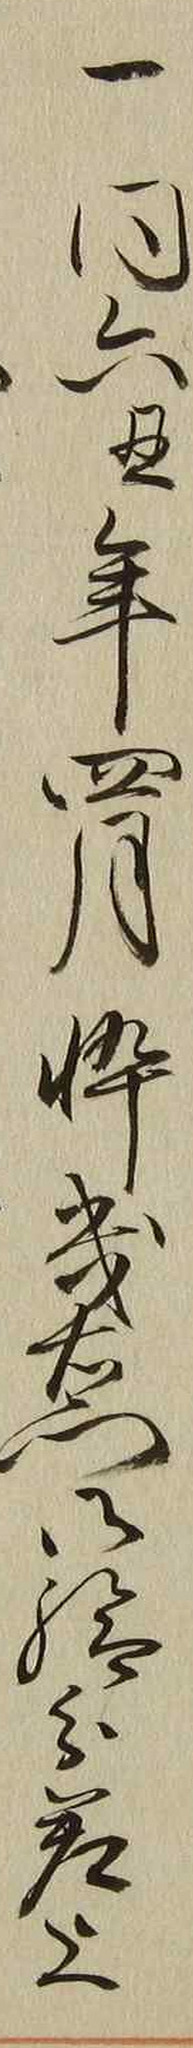一同六丑年四月忰幾右衛門御給分差上
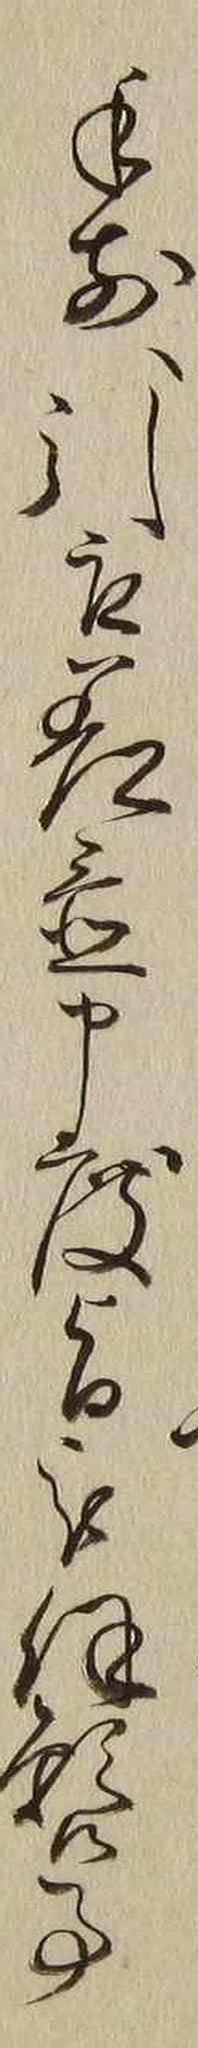手前へ引取差置申度旨被任願候事
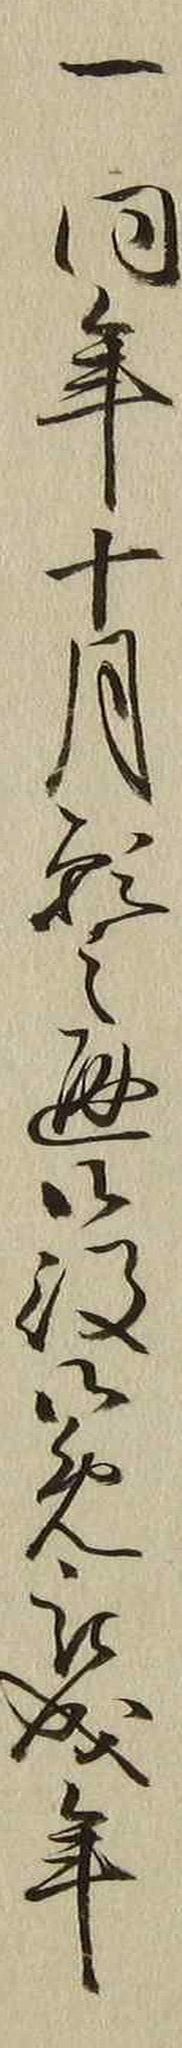一同年十月願之通御役御免被成年
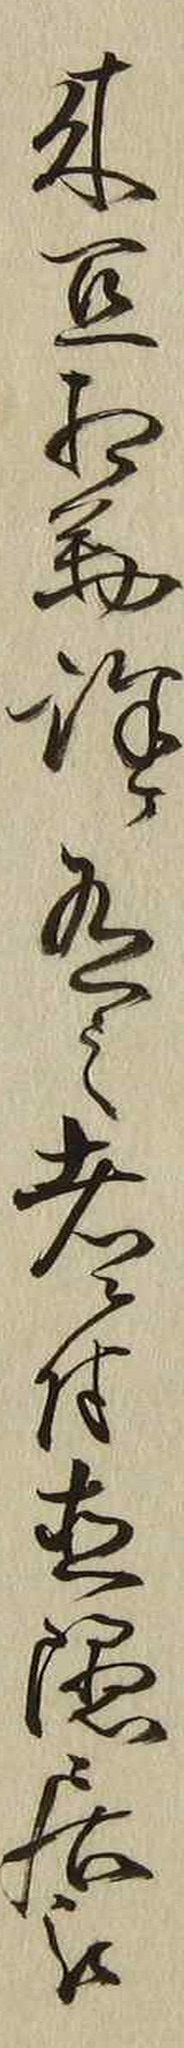来宜相勤訳ヶ有之者ニ付直隠居被
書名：諸士系譜　巻之60　と之部3
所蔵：会津若松市立会津図書館
